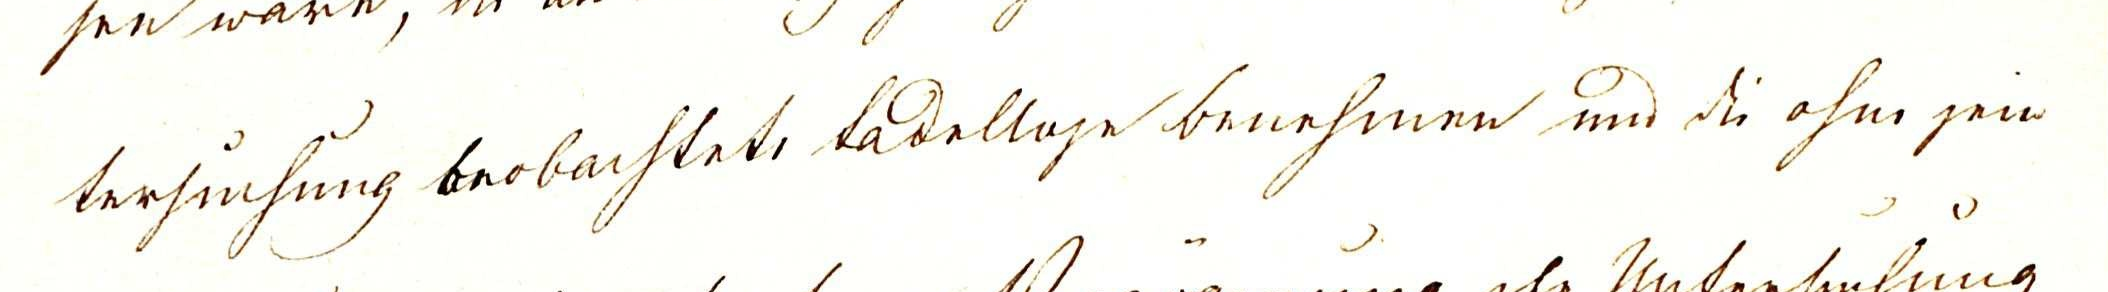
tersuchung beobachtete tadellose benehmen und die ohne sein
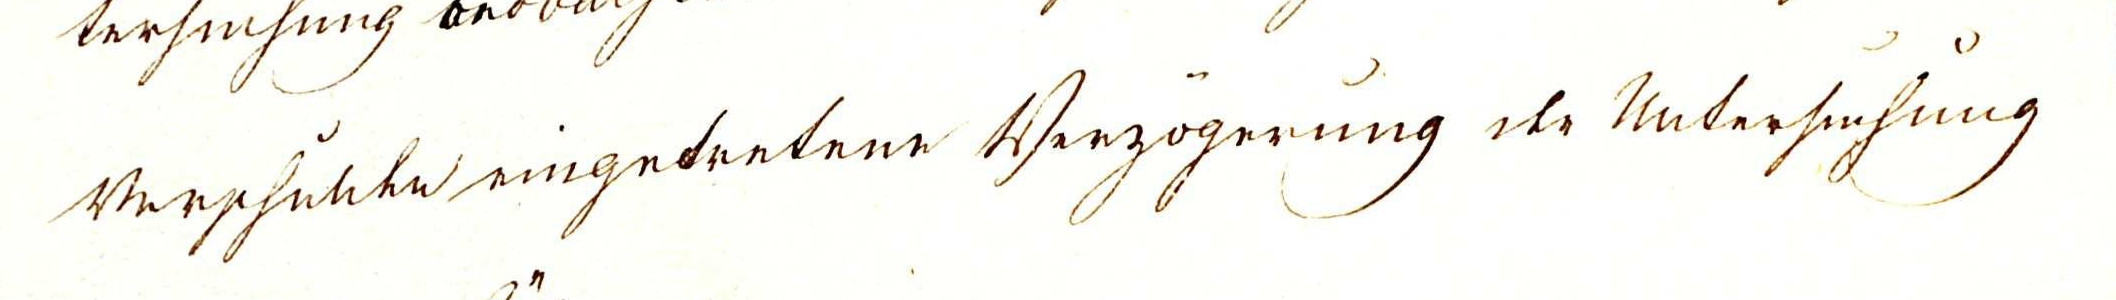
Verschulden eingetretene Verzögerung der Untersuchung
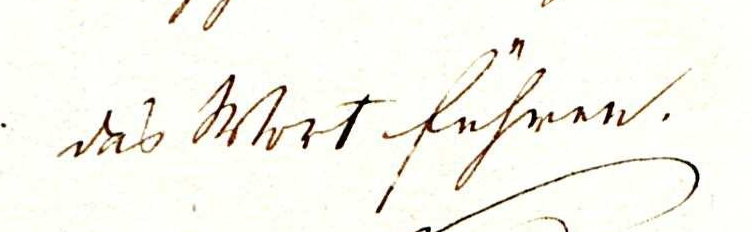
das Wort führen.
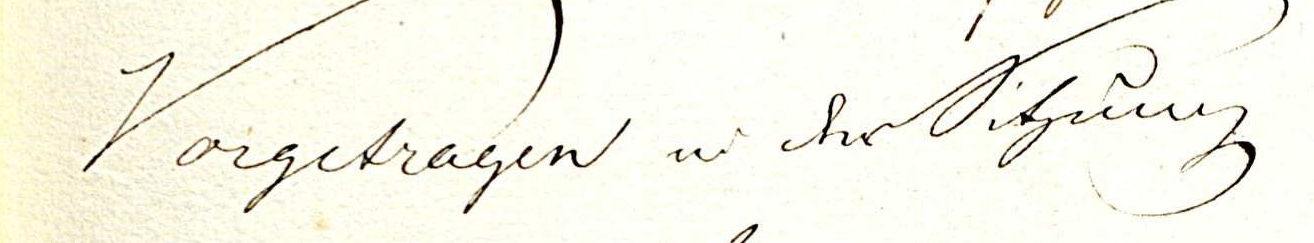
Vorgetragen in der Sitzung
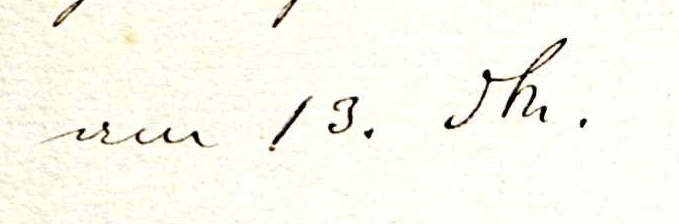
am 13. xx.
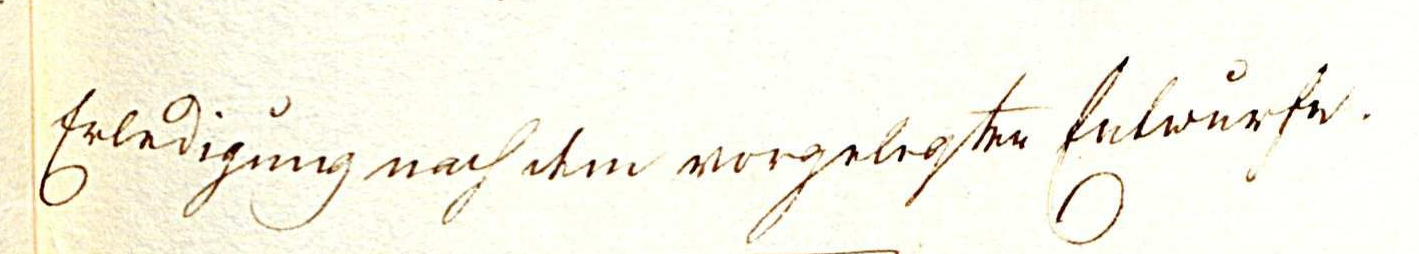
Erledigung nach ihm vorgelegter Entwurfe.
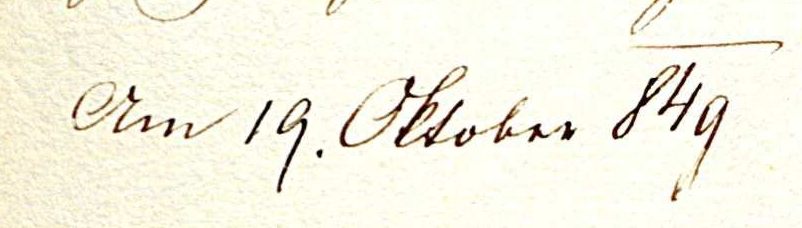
Am. 19. Oktober 849
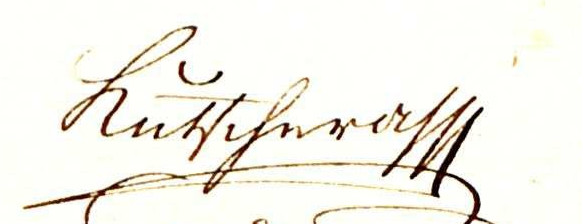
Lutscheraxx
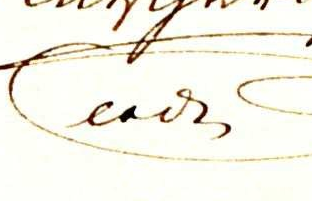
xx
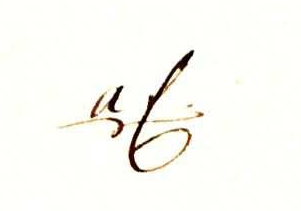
aE.
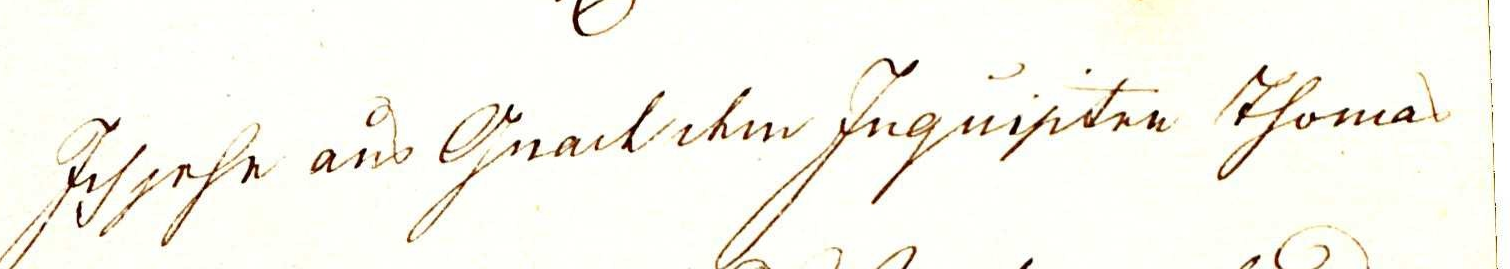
Jch sehe aus Gnade dem Jnquisiten Thomas
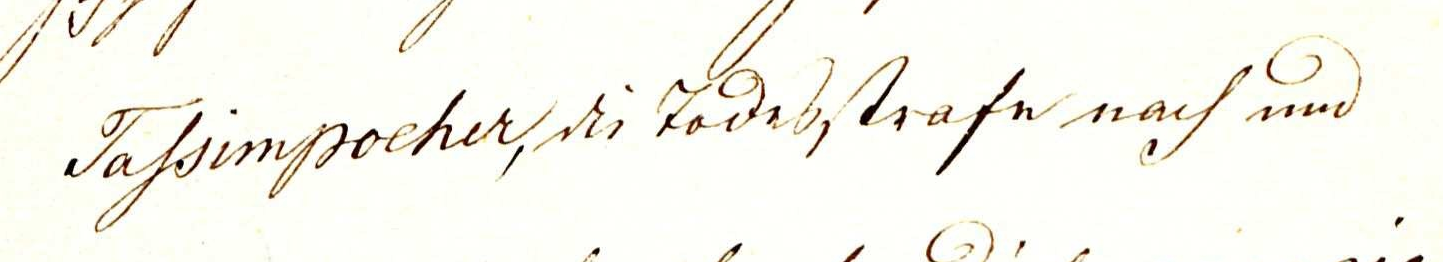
Tassimpocher, die Todesstrafe nach und
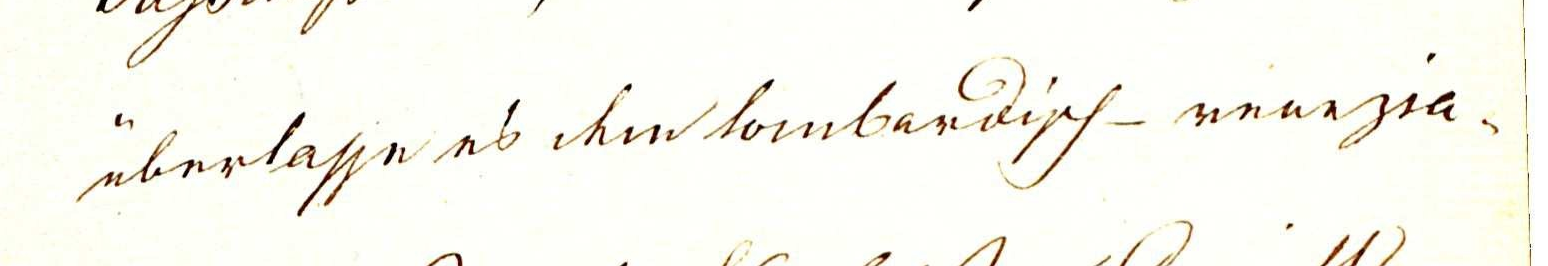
überlasse es dem lombardisch-venezia¬
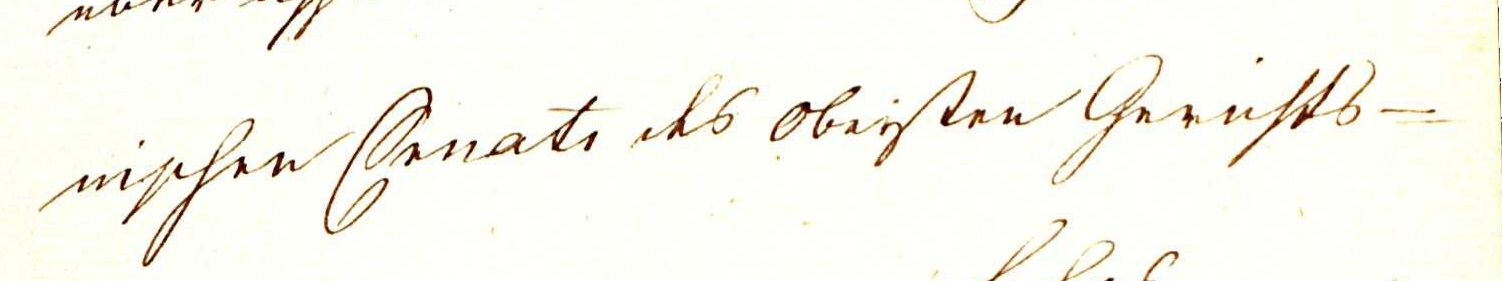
nischen Cenate des obersten Gerichts¬
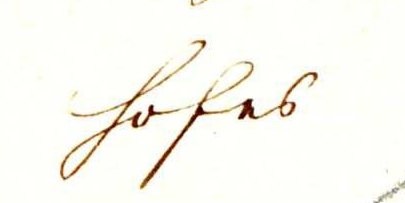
hofes
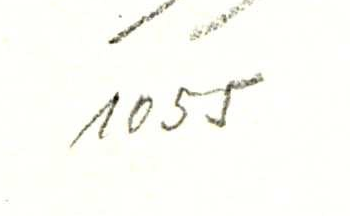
1055
